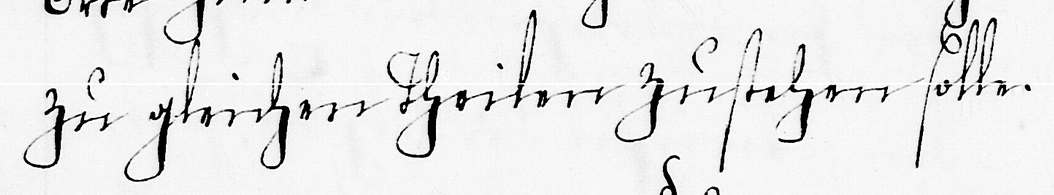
zu gleichen Theilen zustehen solle.
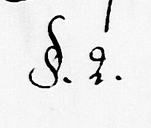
§. 2.
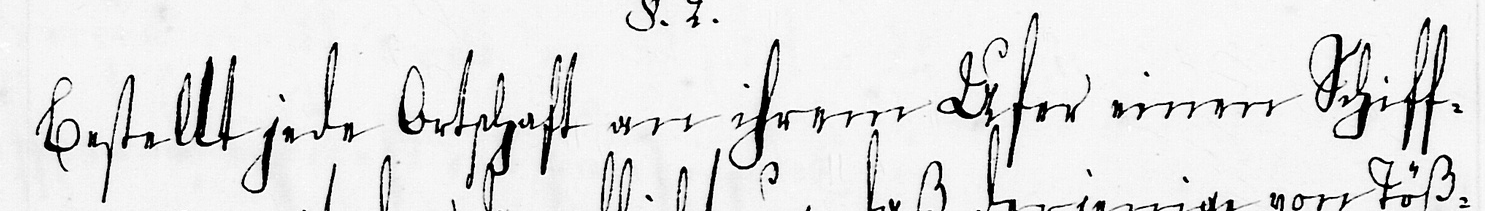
Bestellt jede Ortschaft an ihrem Ufer einen Schiff¬
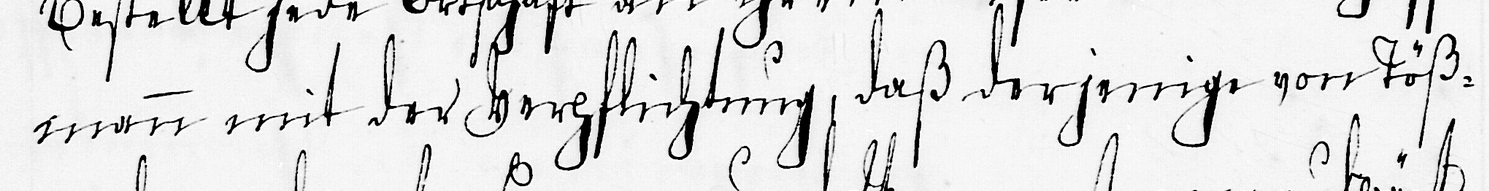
mann mit der Verpflichtung, daß derjenige von Töß¬
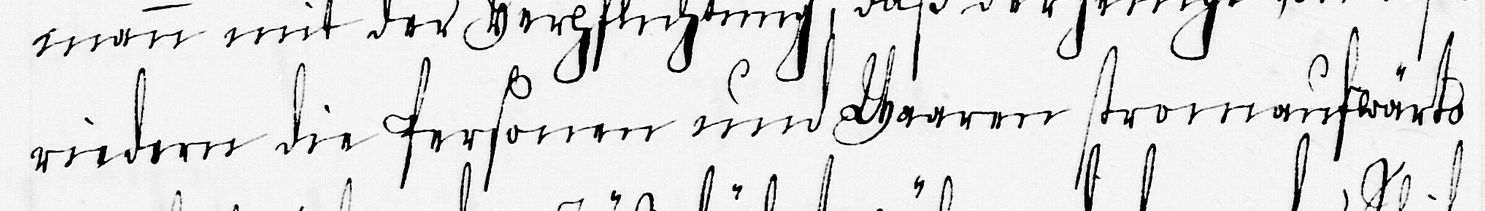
riedern die Personen und Waaren stromaufwärts
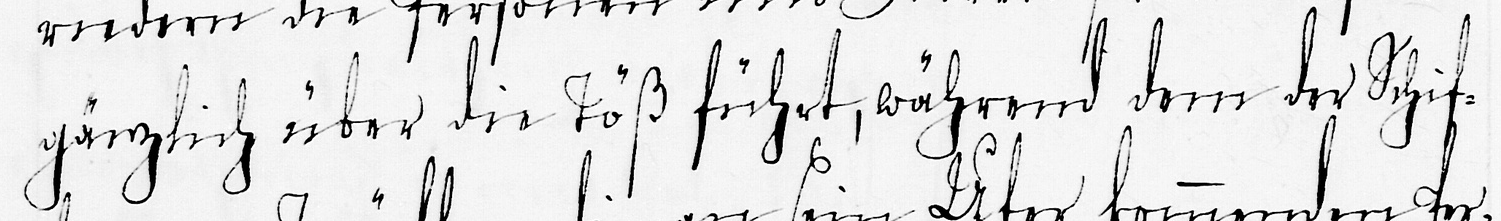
gänzlich über die Töß führt, während dem der Schif¬
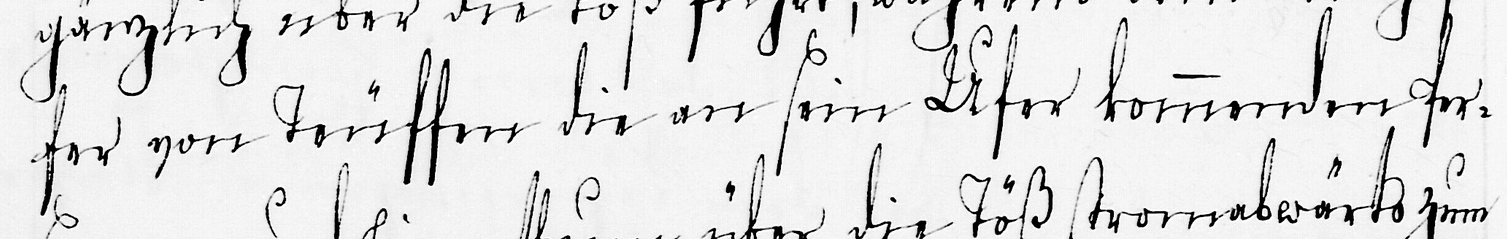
fer von Teuffen die an sein Ufer kommenden Pers¬
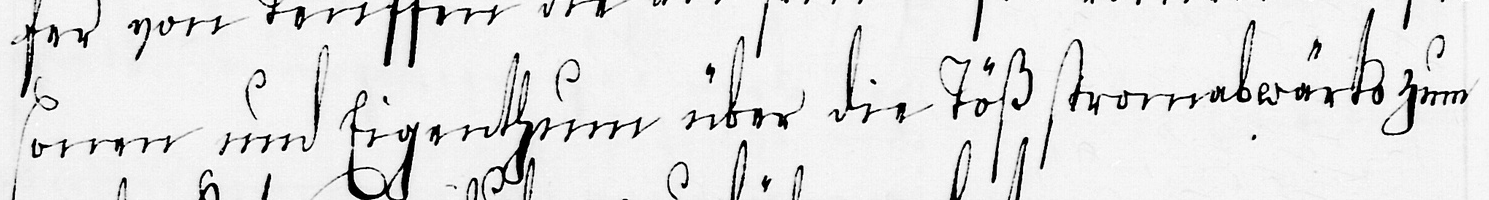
onen und Eigenthum über die Töß stromabwärts zum
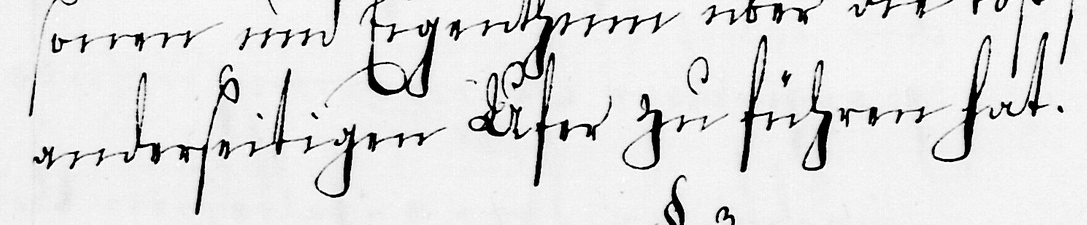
anderseitigen Ufer zu führen hat.
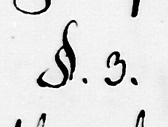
§. 3.
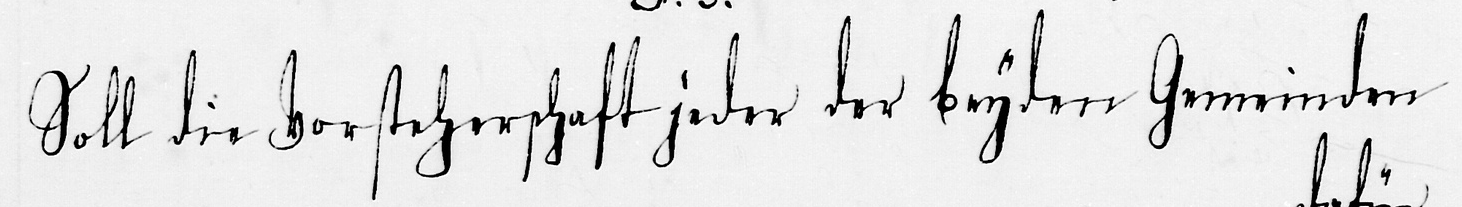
Soll die Vorsteherschaft jeder der beyden Gemeinden
